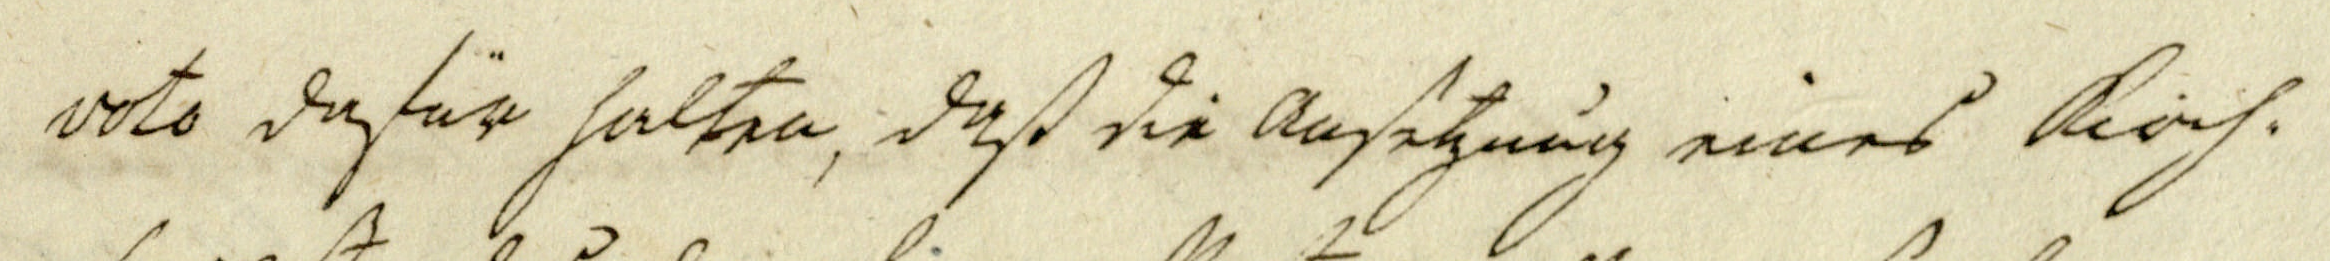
voto dafür halten, daß die Ansetzung eines Kirch¬
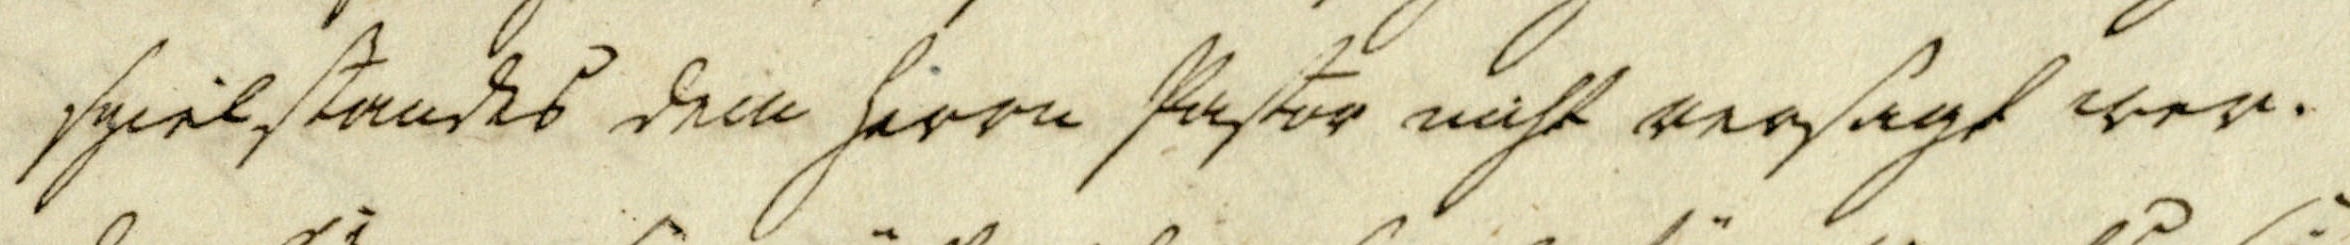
spielstandes dem Herrn Pastor nicht versagt wer¬
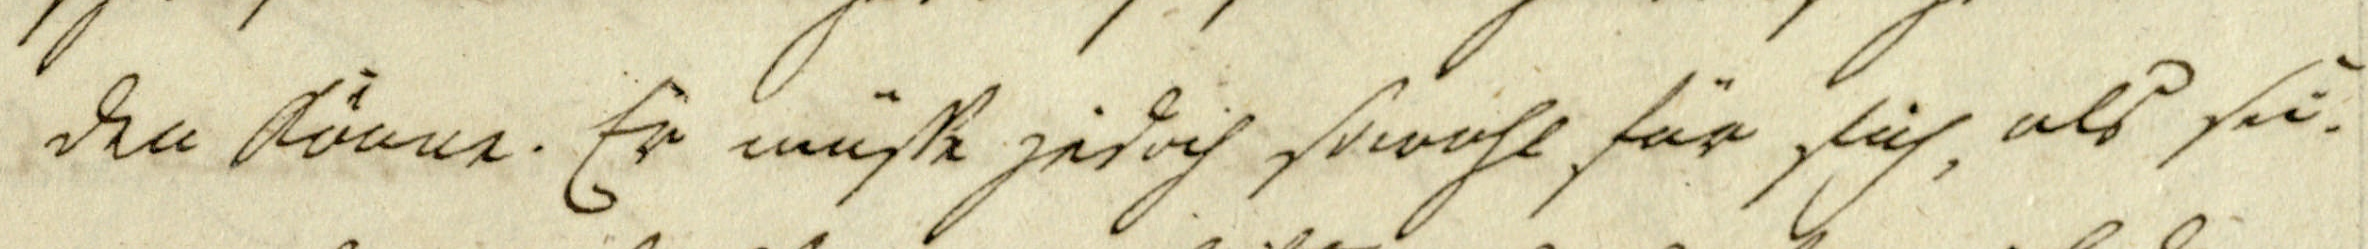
den könne. Er müsse jedoch sowohl für sich als sei¬
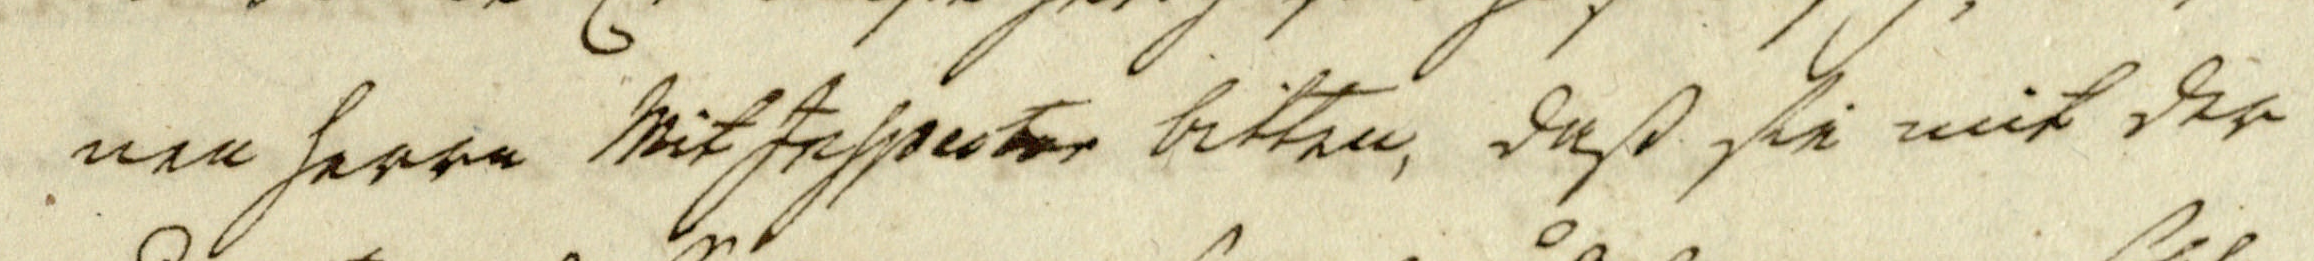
nen herrn Mit Inspector bitten, daß sie mit der
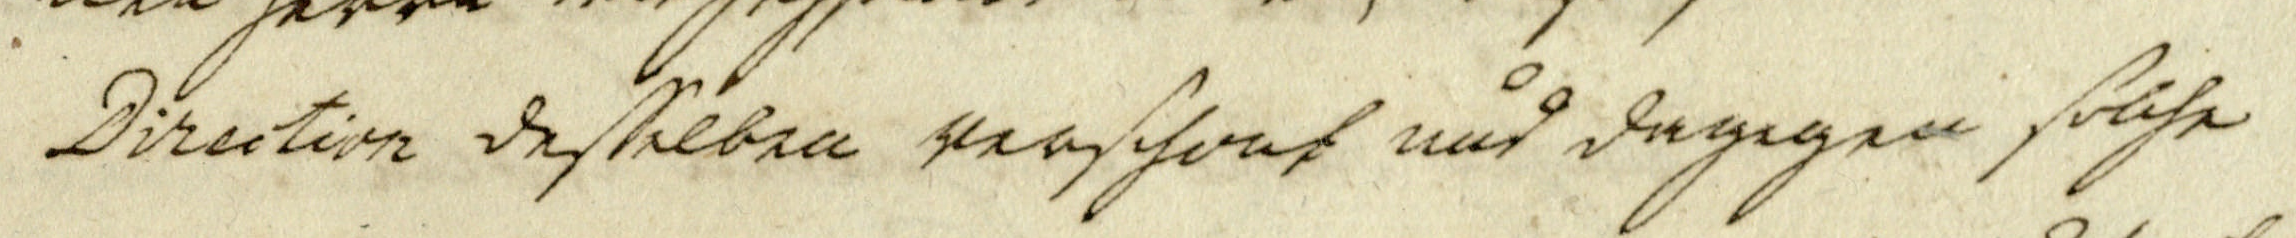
Direction desselben verschont und dagegen solche
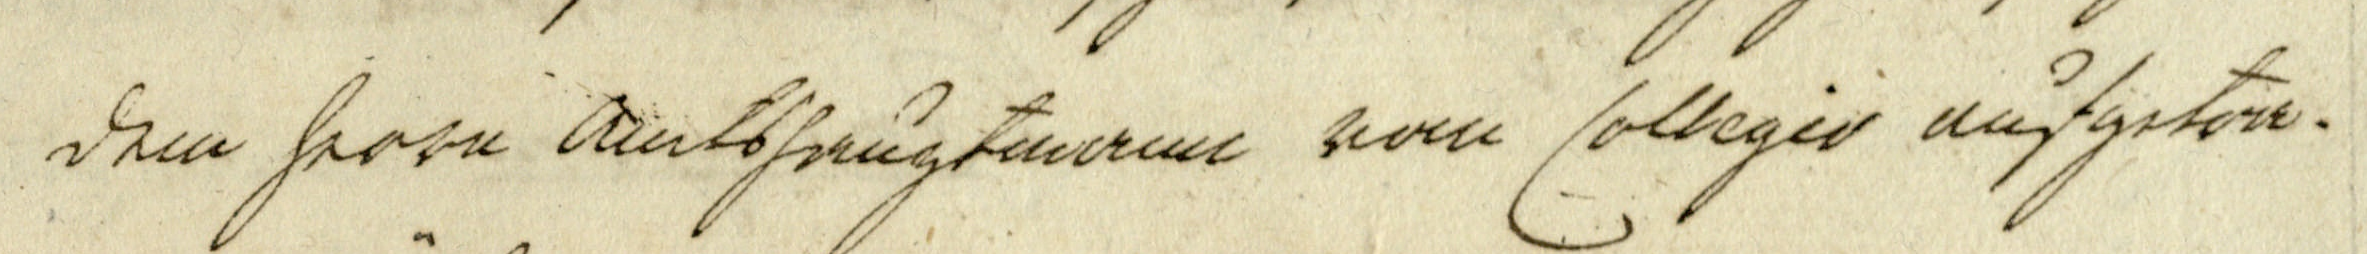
dem herrn Amtshauptmann vom Collegio aufgetra¬
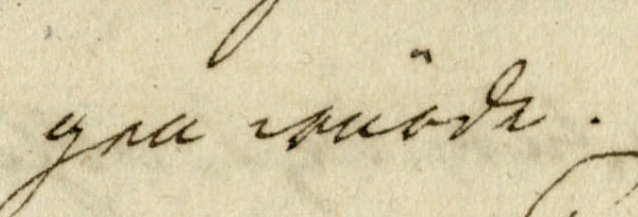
gen würde.
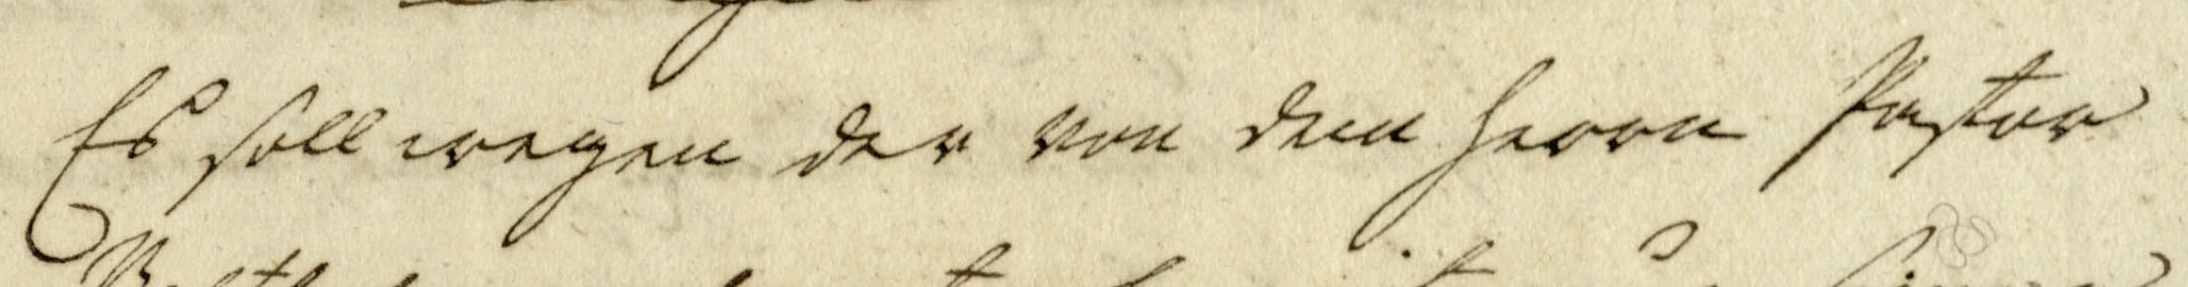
Es soll wegen der von dem herrn Pastor
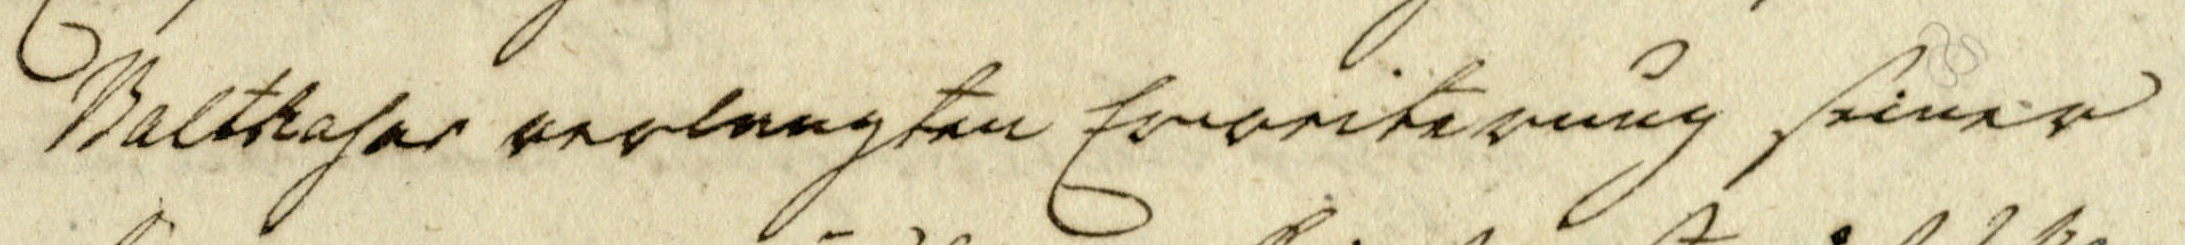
Balthasar verlangten Erweiterung seiner
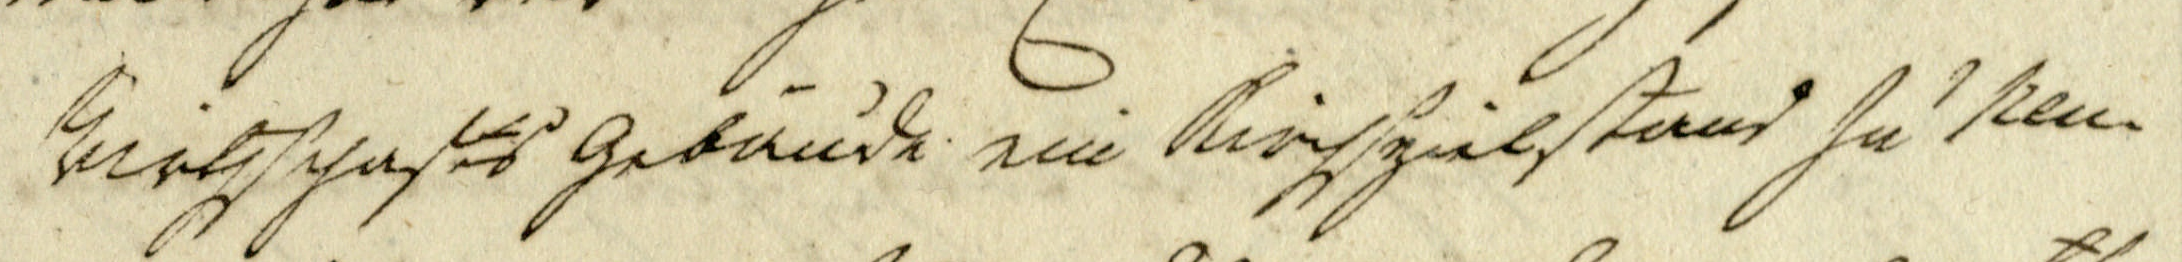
Wirthschafts Gebäude ein Kirchspielstand zu Neu¬
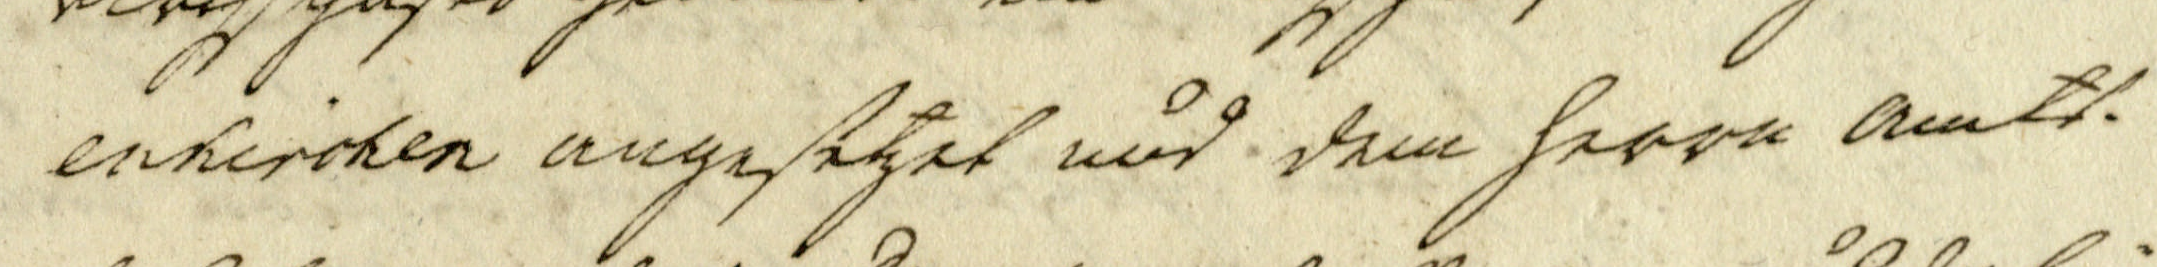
enkirchen angesetzet und dem herrn Amts¬
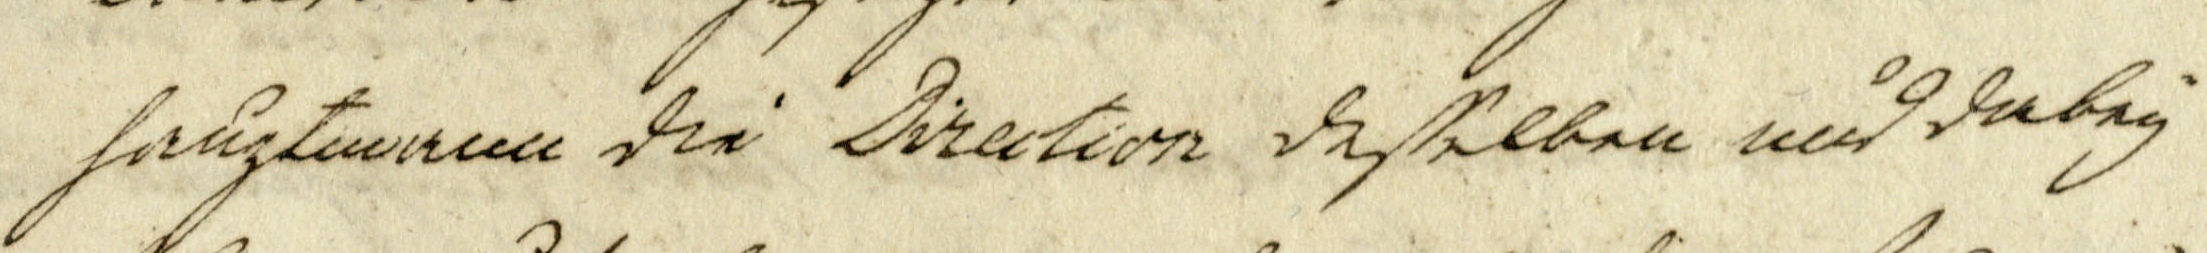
hauptmann die Direction desselben und dabeÿ
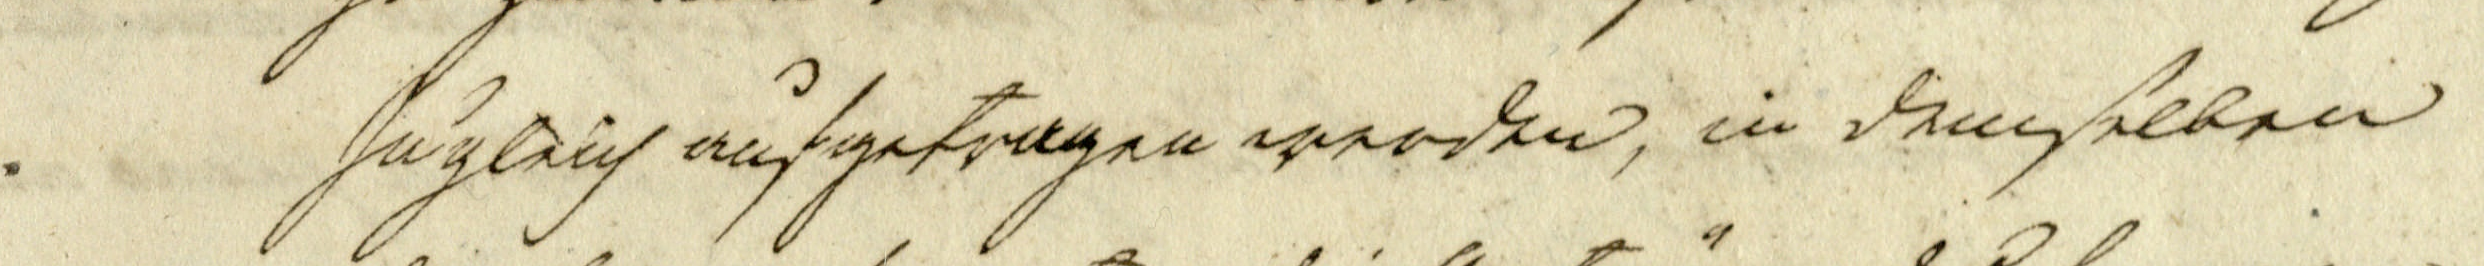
zugleich aufgetragen werden, in demselben
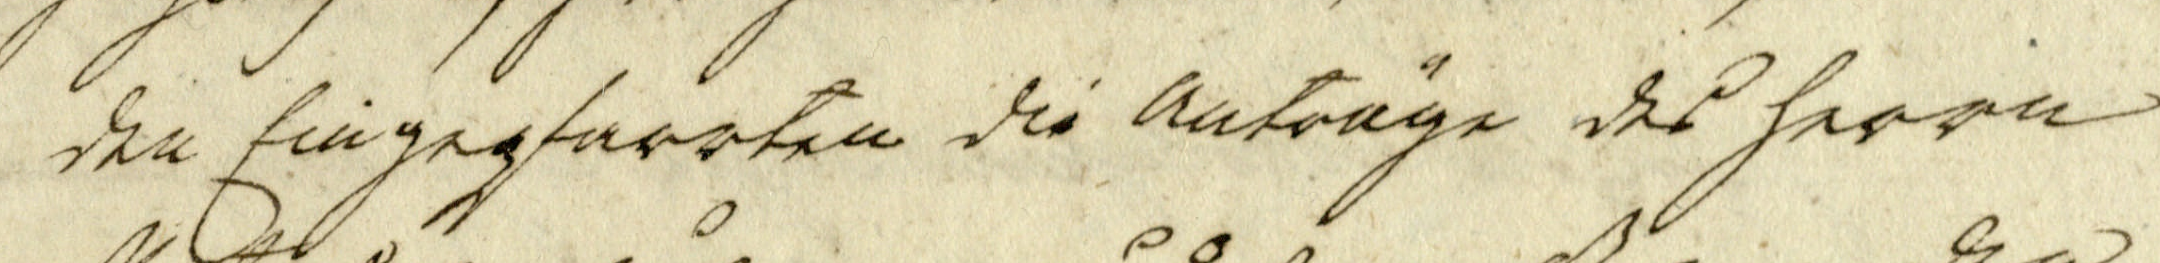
den Eingepfarrten die Anträge des herrn
